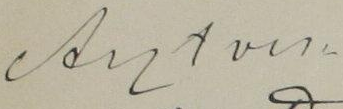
Arztver-
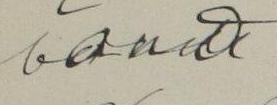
band
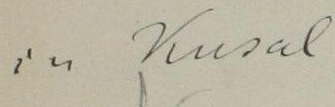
in Kusal
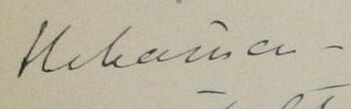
Hebammen-
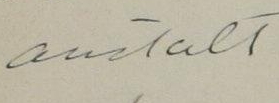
anstalt
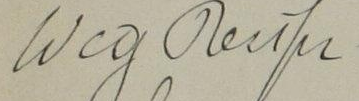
Weg Restfer
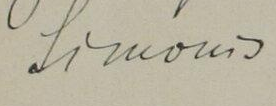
Simonis
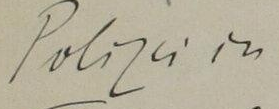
Polizei in
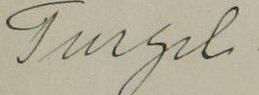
Turgel
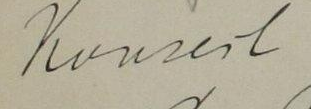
Konseil
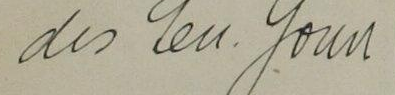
des Gen. Gouv
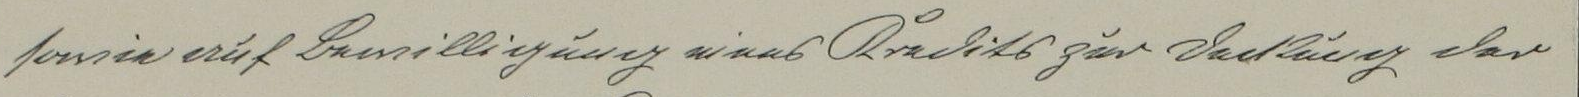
sowie auf Bewilligung eines Kredits zur Deckung der
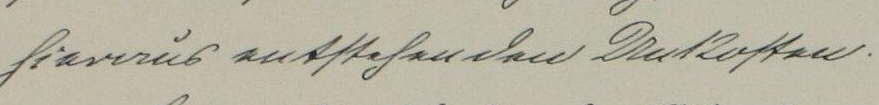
hieraus entstehenden Unkosten.
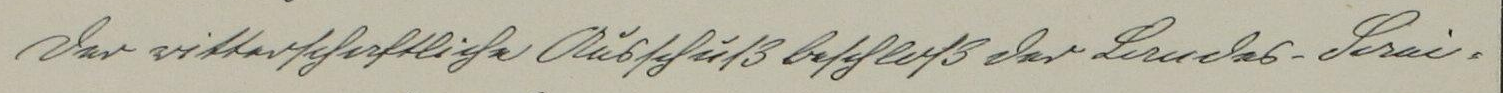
Der ritterschaftliche Ausschuß beschloß der Landes-Sani-
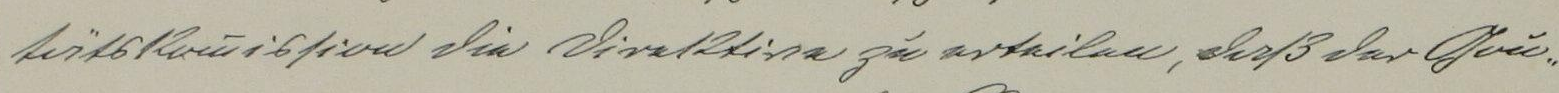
tätskommission die Direktive zu erteilen, daß der Gou-
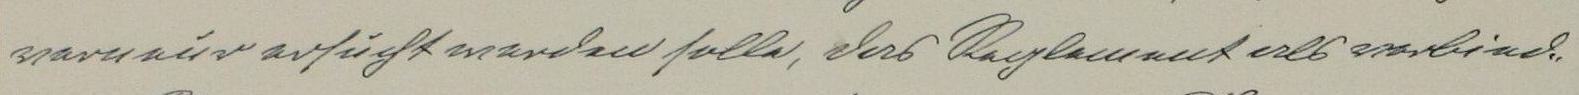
verneur ersucht werden solle, das Reglement als verbind-
